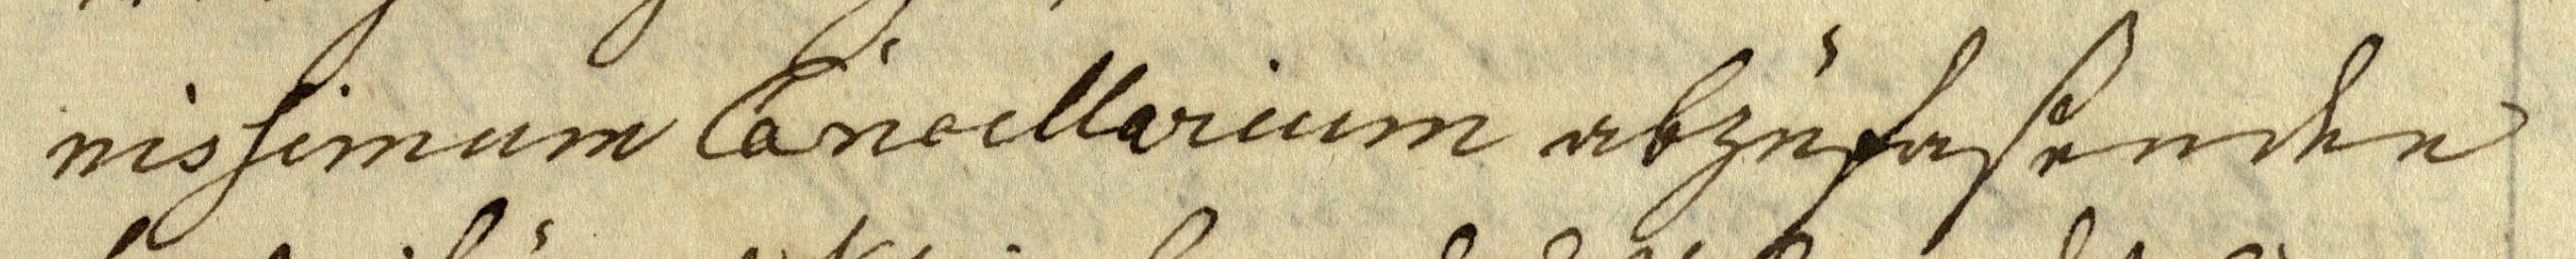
nissimum Cancellarium abzufaßenden
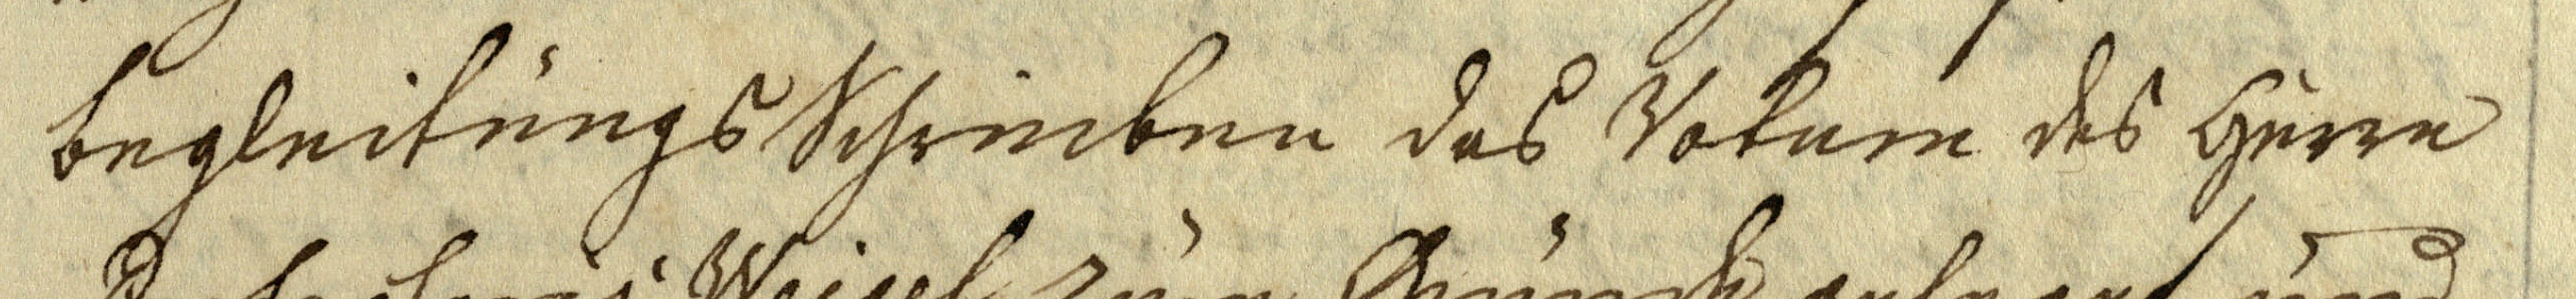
Begleitungs Schreiben das Votum des Herrn
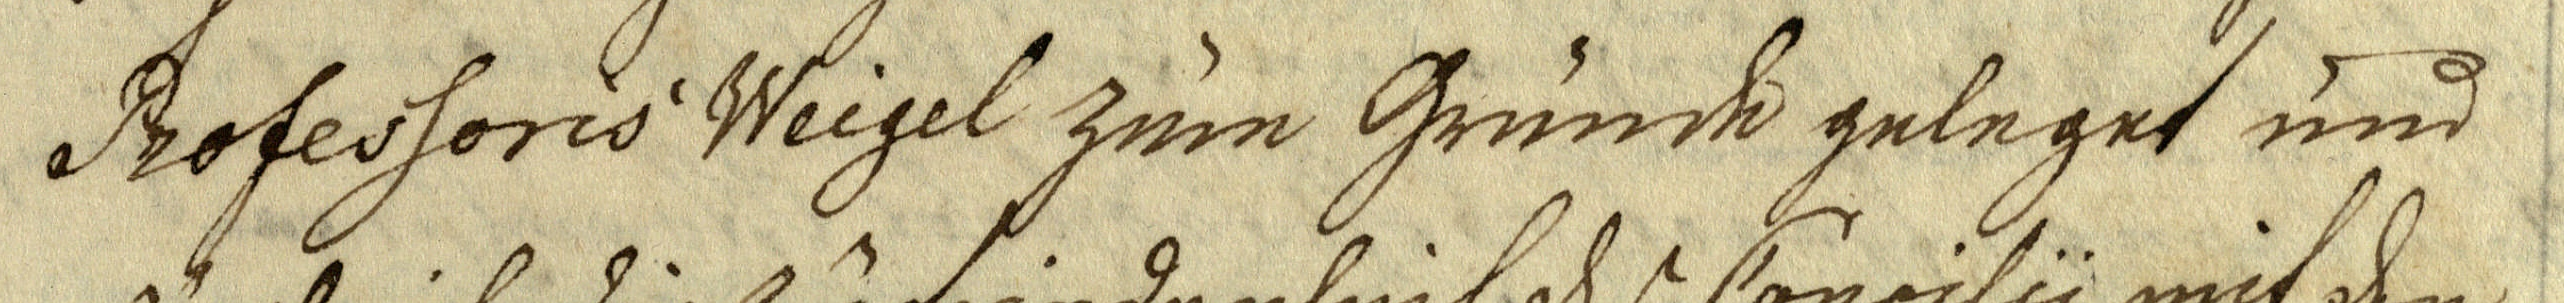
Professoris Weigel zum Grunde geleget und
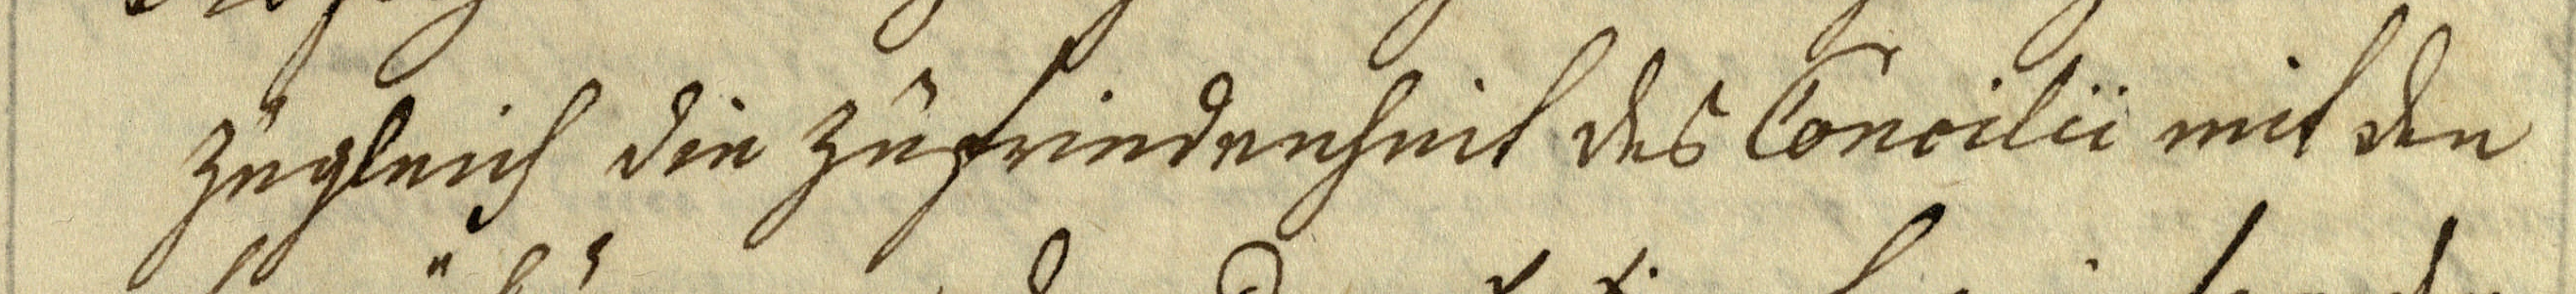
zugleich die Zufriedenheit des Concilii mit den
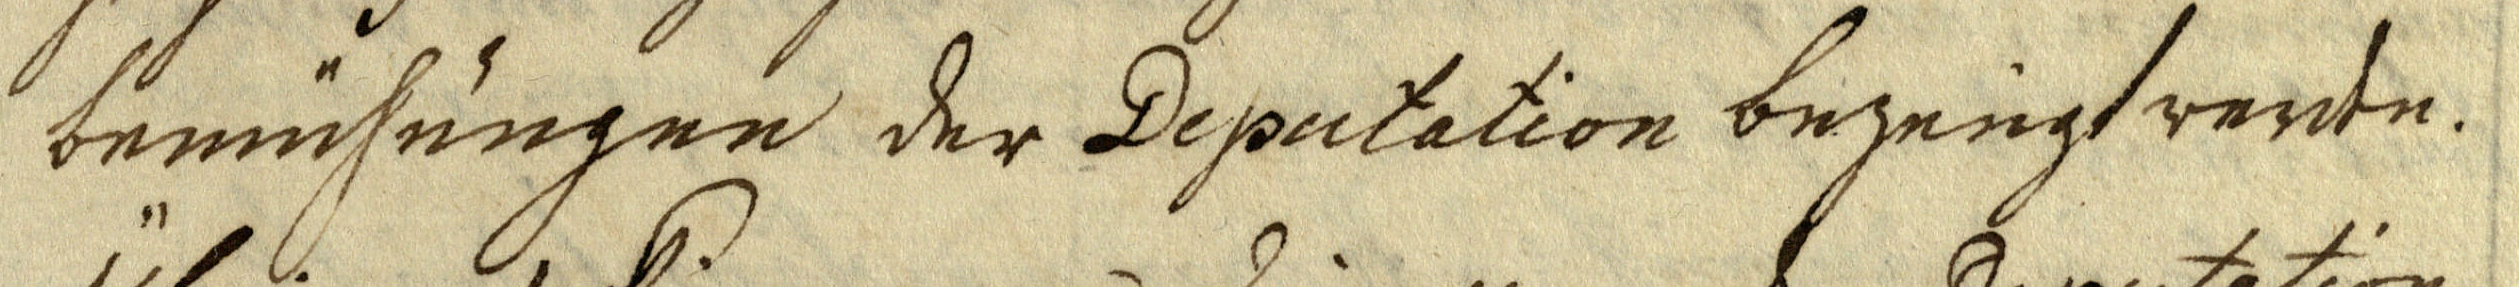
Bemühungen der Deputation bezeugt werden.
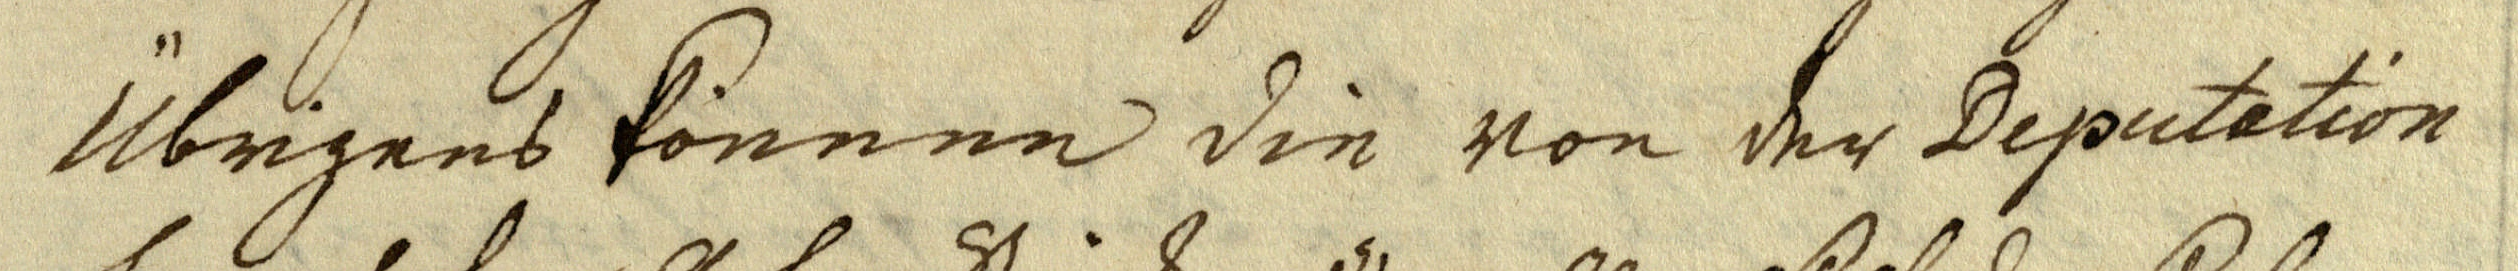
Übrigens können die von der Deputation
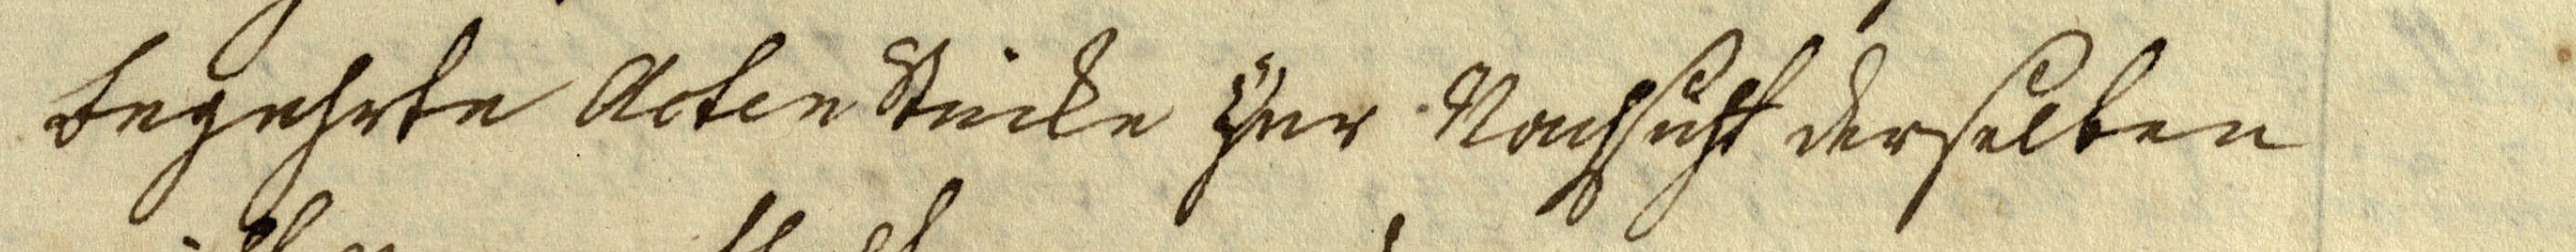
begehrte Acten Stücke zur Nachsicht derselben
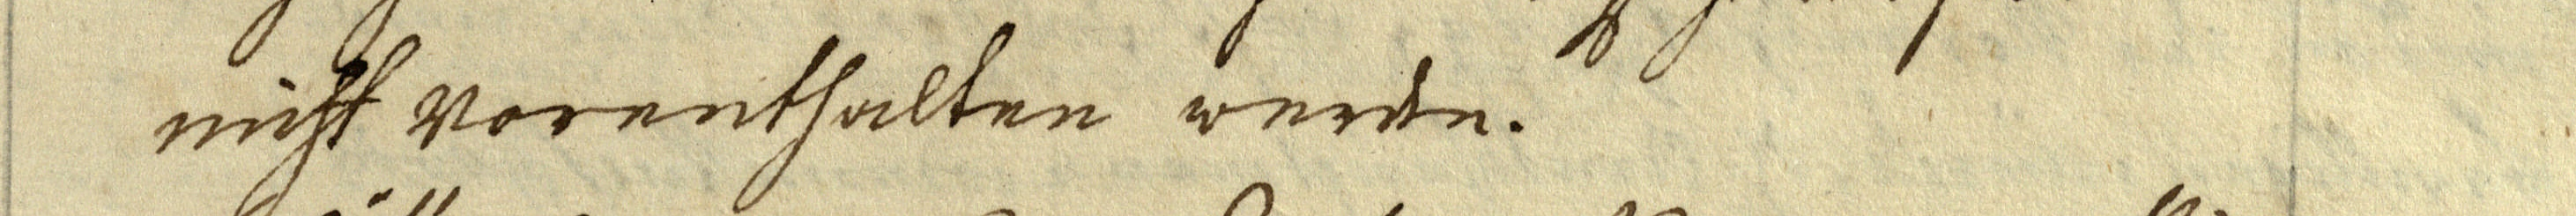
nicht vorenthalten werden.
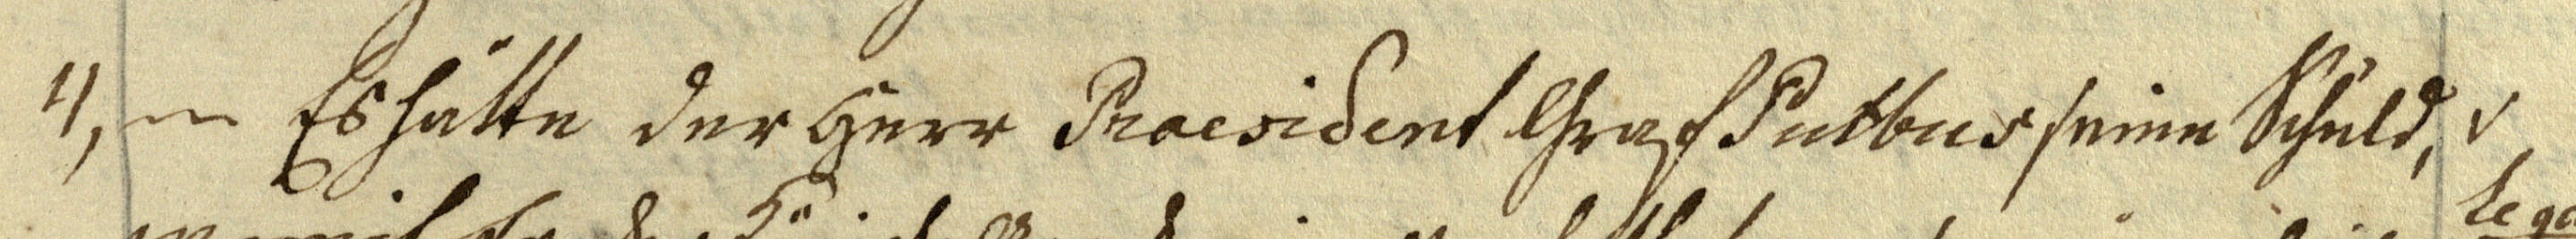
4. Es hätte der Herr Praesident Graf Putbus seine Schuld,
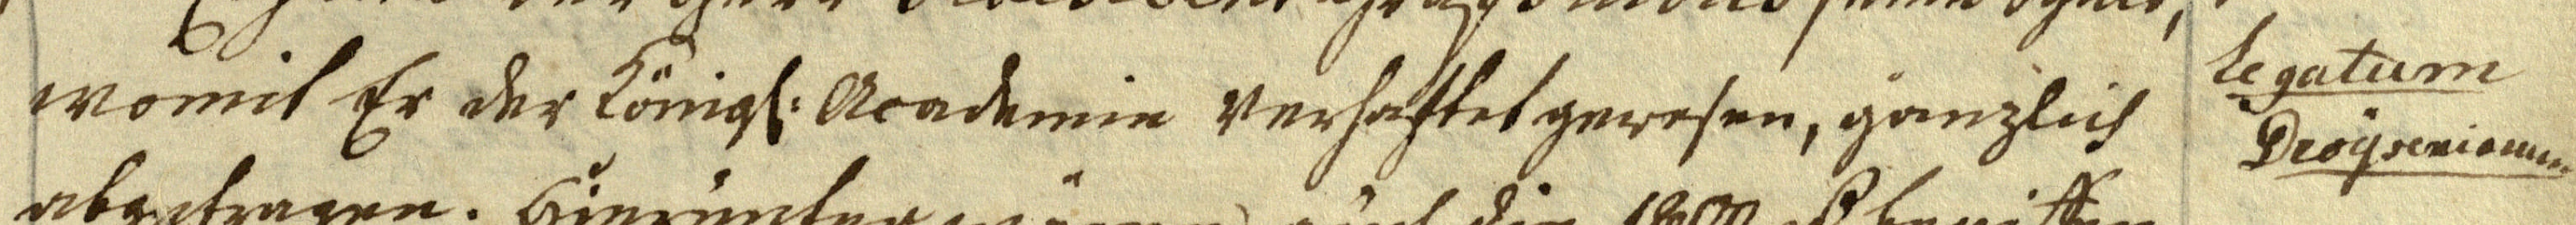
womit Er der Königl: Academie verhaftet gewesen, gänzlich Legatum Droÿsenianum
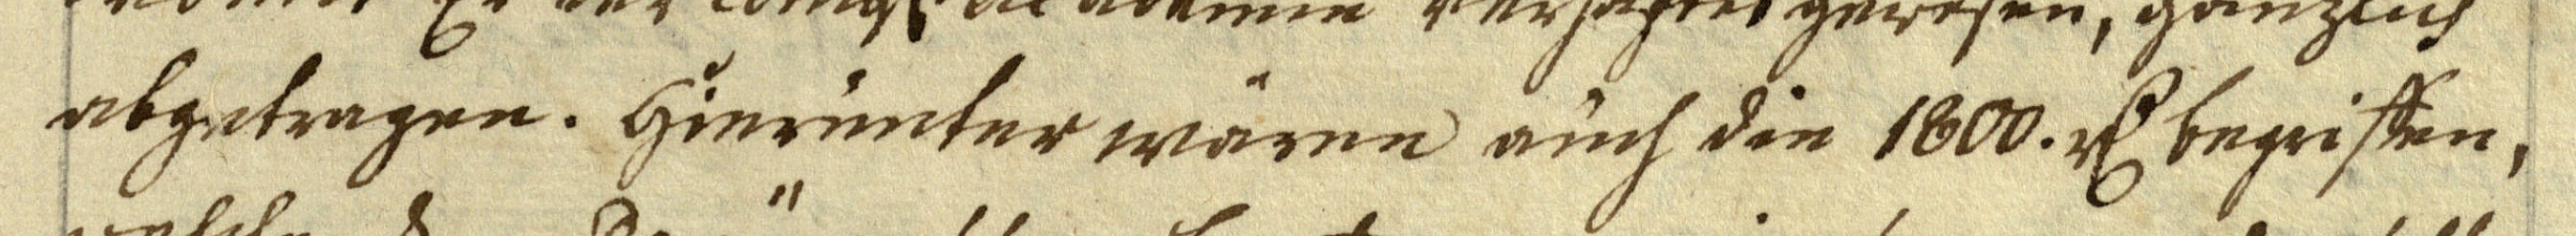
abgetragen. Hierunter wären auch die 1800. r begriffen,
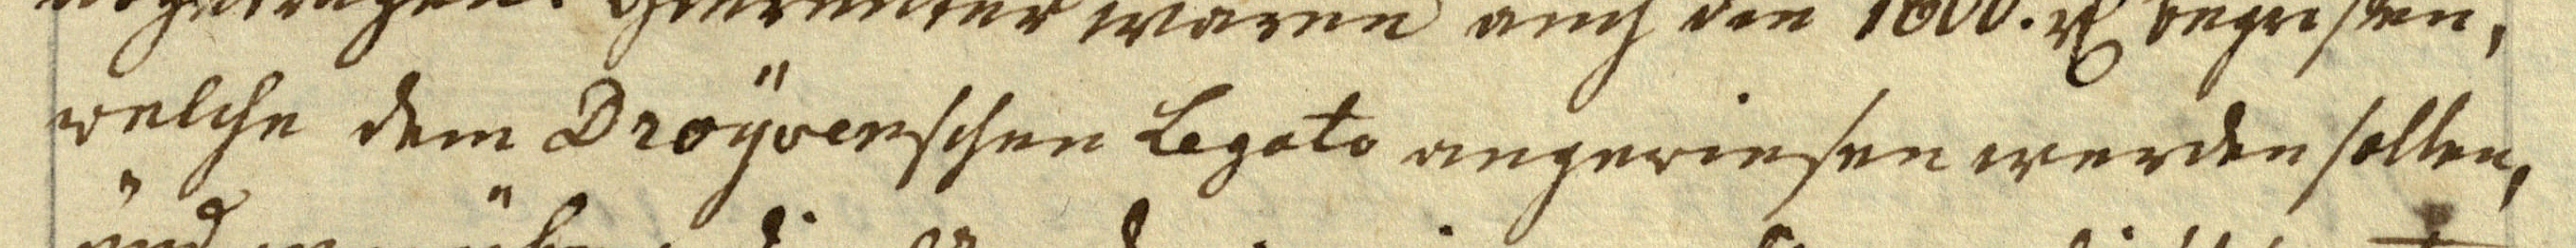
welche dem Droÿsenschen Legato angewiesen werden sollen,
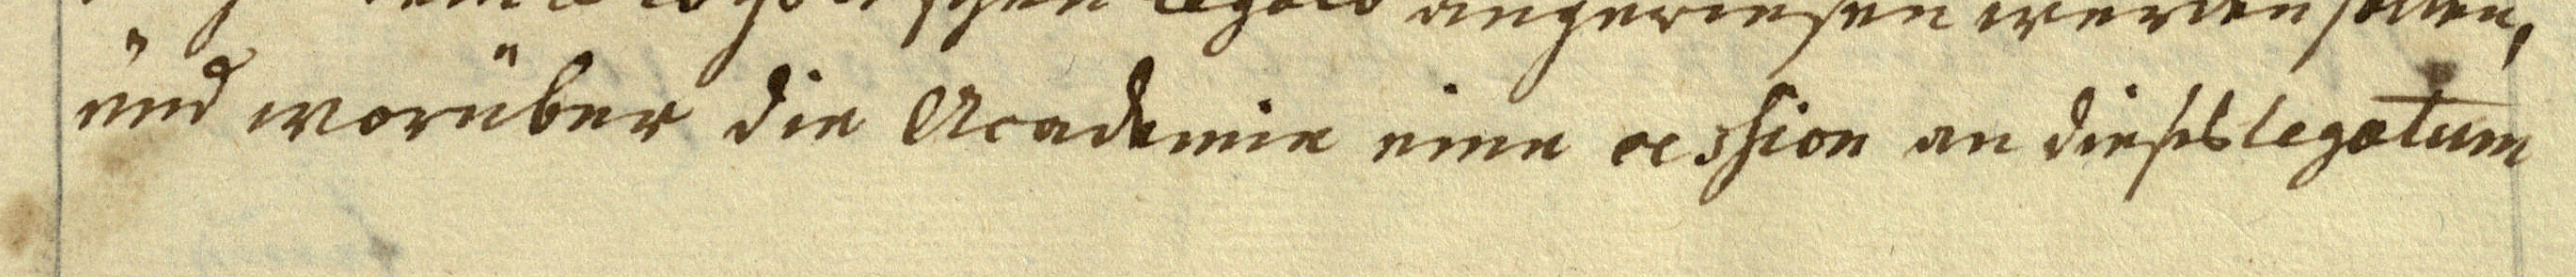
und worüber die Academie eine cession an dieses legatum
